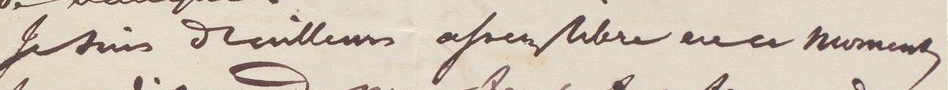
Je suis d'ailleurs assez libre en ce moment
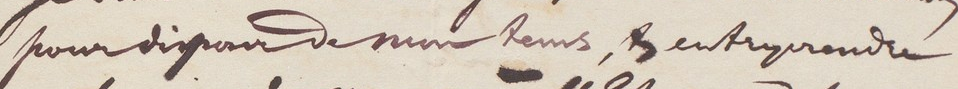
pour disposer de mes tems, & entreprendre
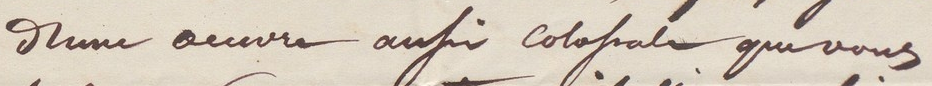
d`une oeuvre aussi colossale que vous
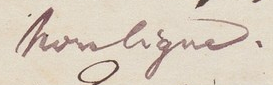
hors ligne.
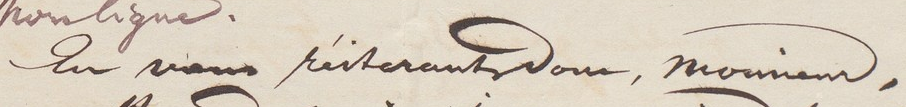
En vous réiterant donc, Monsieur,
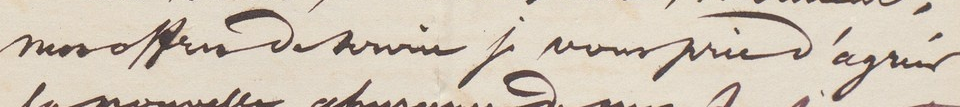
mes offres de service je vous prie d'agréer
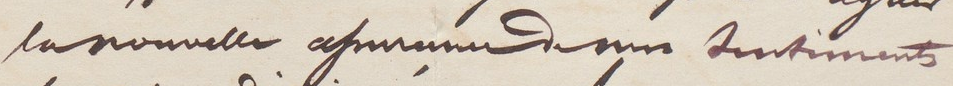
la nouvelle assurance de mes sentiments
